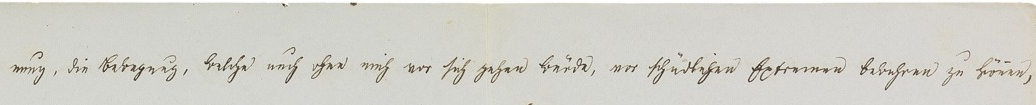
nung, die Bewegung, welche auch ohne mich vor sich gehen würde, vor schädlichen Extremen bewahren zu können,
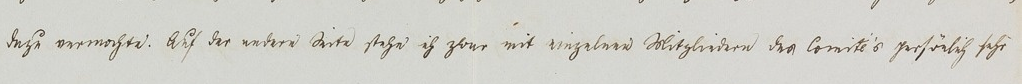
dazu vermochte. Auf der andern Seite stehe ich zwar mit einzelnen Mitgliedern des Comité's persönlich sehr
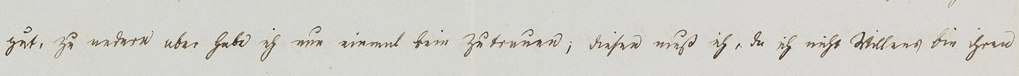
gut, zu andern aber habe ich nun einmal kein Zutrauen; diesen muß ich, da ich nicht Willens bin ihren
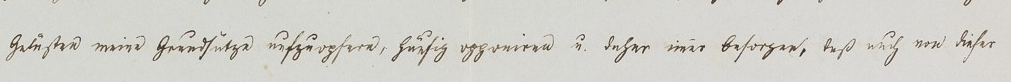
Gelüsten meine Grundsätze aufzuopfern, häufig opponiren u. daher immer besorgen, daß auch von dieser
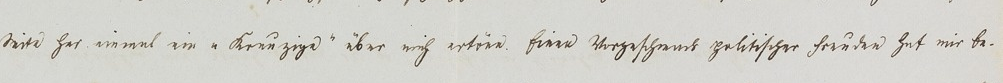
Seite her einmal ein «Kreuzige» über mich ertöne. Einen Vorgeschmack politischer Freuden hat mir be-
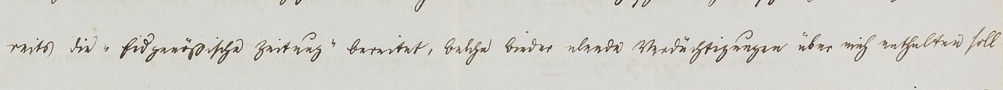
reits die «Eidgenößische Zeitung» bereitet, welche wieder elende Verdächtigungen über mich enthalten soll
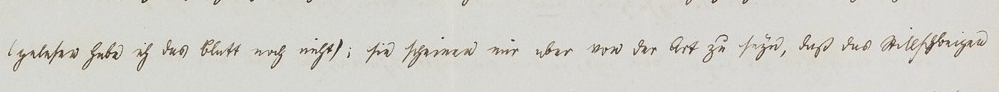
(gelesen habe ich das Blatt noch nicht); sie scheinen mir aber von der Art zu seyn, daß das Stillschweigen
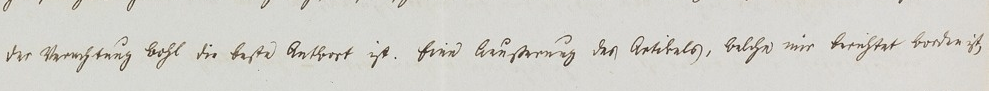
der Verachtung wohl die beste Antwort ist. eine Aeußerung des Artikels, welche mir berichtet worden ist,
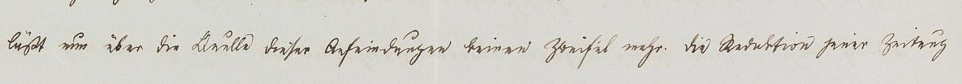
läßt nun über die Quelle dieser Anfeindungen keinen Zweifel mehr. Die Redaktion jener Zeitung
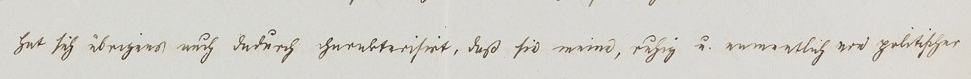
hat sich übrigens auch dadurch charakterisirt, daß sie meine, ruhig u. namentlich von politischer
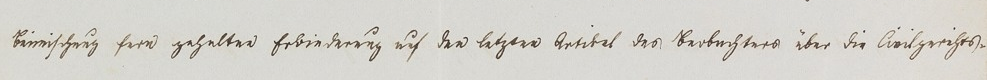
Beimischung fern gehaltne Erwiederung auf den letzten Artikel des Beobachters über die Civilgerichts-
